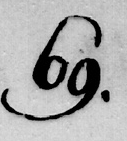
16.
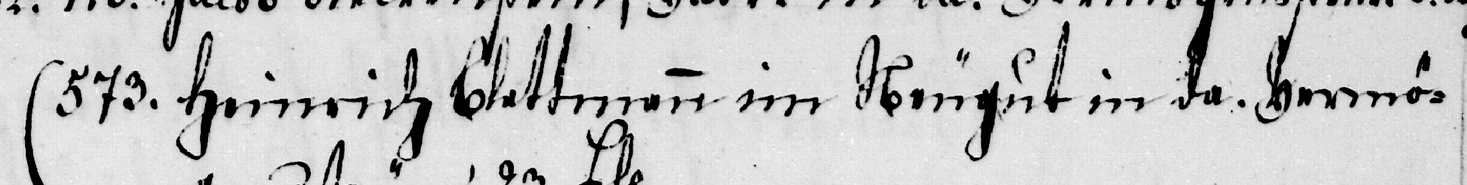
573. Heinrich Blattmann im Neugut in da. Vermö¬
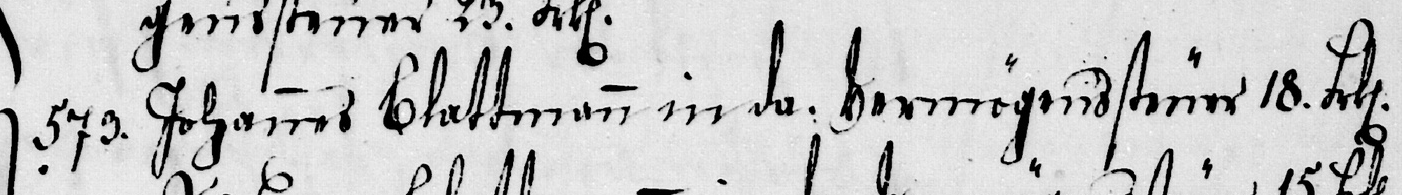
573. Johannes Blattmann in da. Vermögenssteuer 18. Fr¬
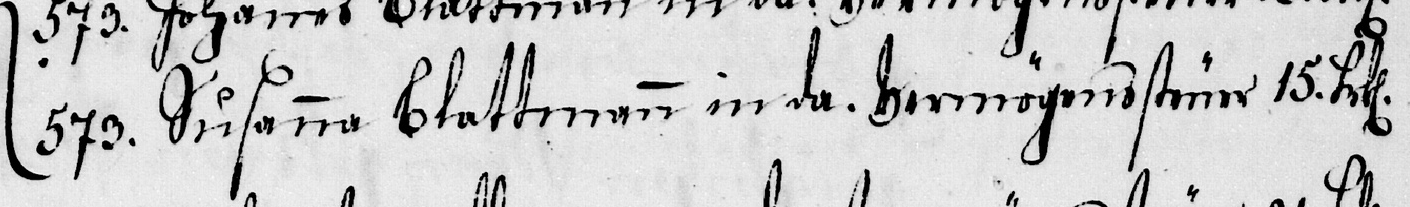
573. Susanna Blattmann in da. Vermögenssteuer 15. Fr¬
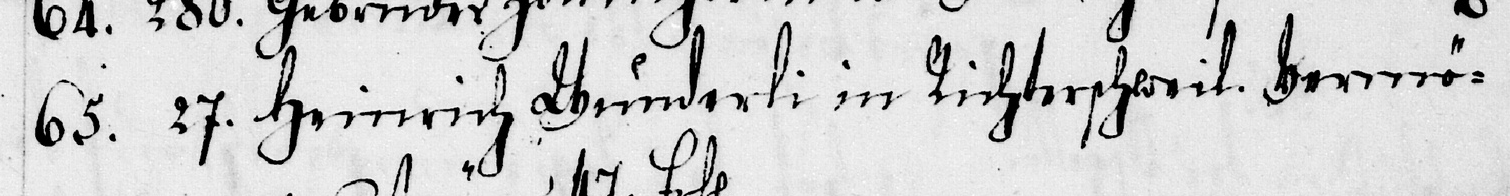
65. 27. Heinrich Wunderli in Richterschweil. Vermö¬
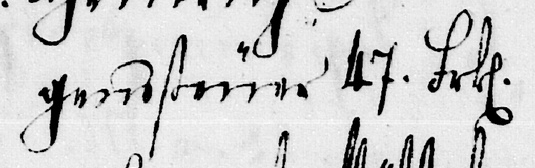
genssteuer 47. Frk[e¬
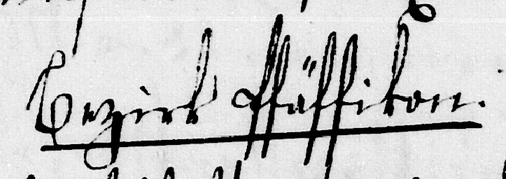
Bezirk Pfäffikon.
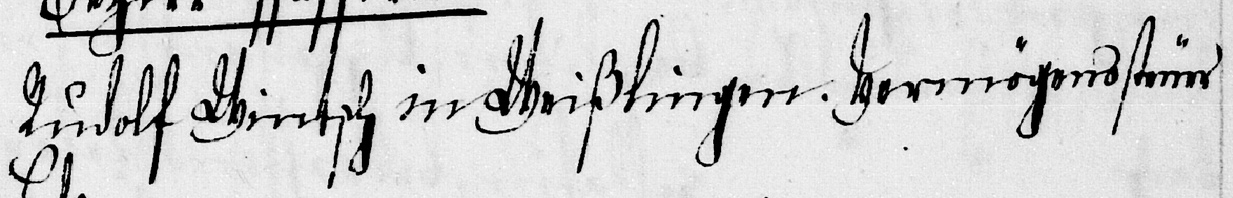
Rudolf Wintsch in Weißlingen. Vermögenssteuer
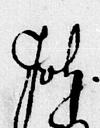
Joh.
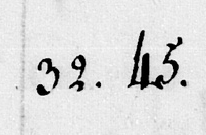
32. 45.
